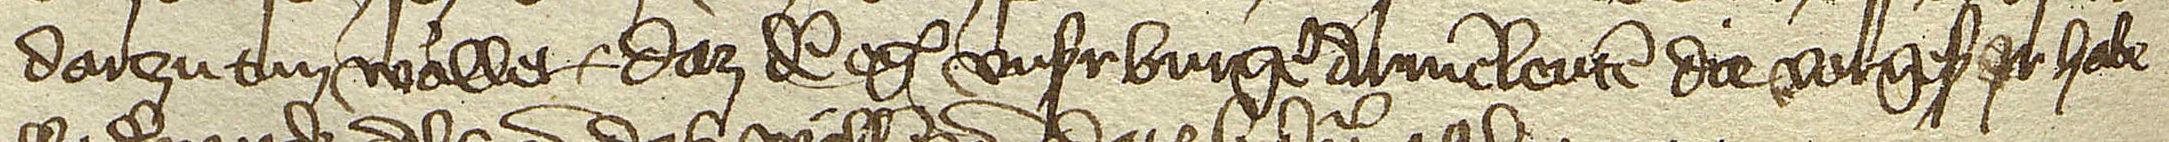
darcʒu tun wöllet / daʒ d* eg* vnſ*r burge* Arme*leute* die vorgeſ* Ir habe
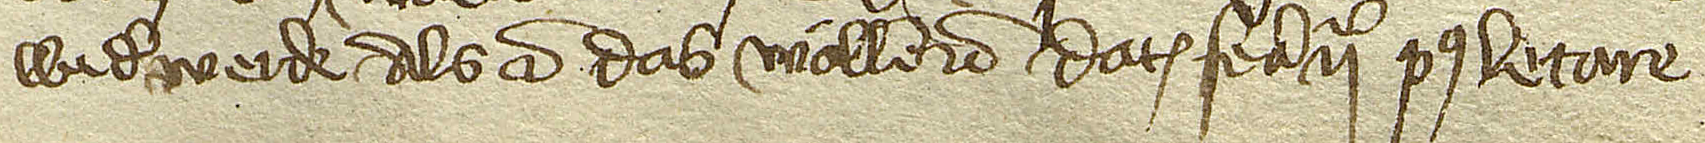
wid* werde / Als ec* das wölle* ec* / dat* fea* ii* p* letare
